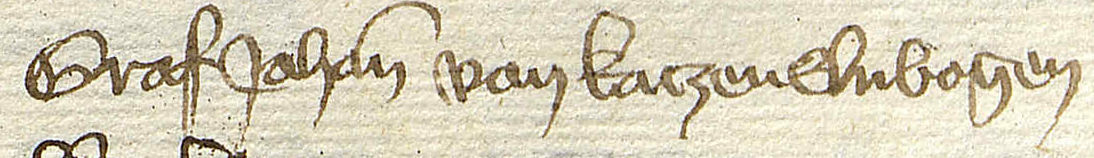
Graf Iohan* von kacʒenElnbogen
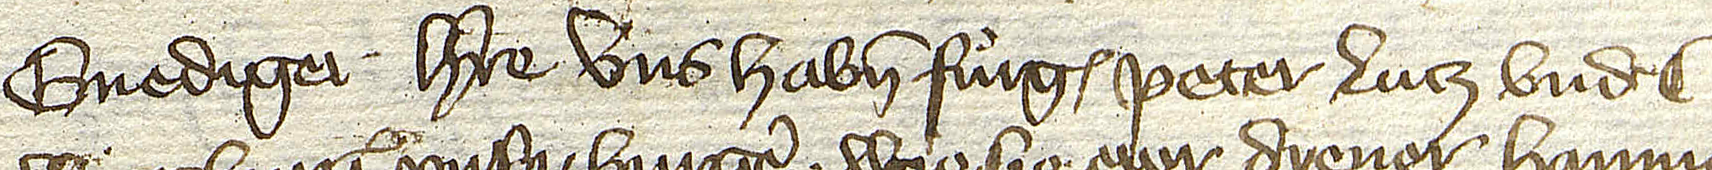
Gnediger h*re vns habn* fürg* Peter Lucʒ vnd C
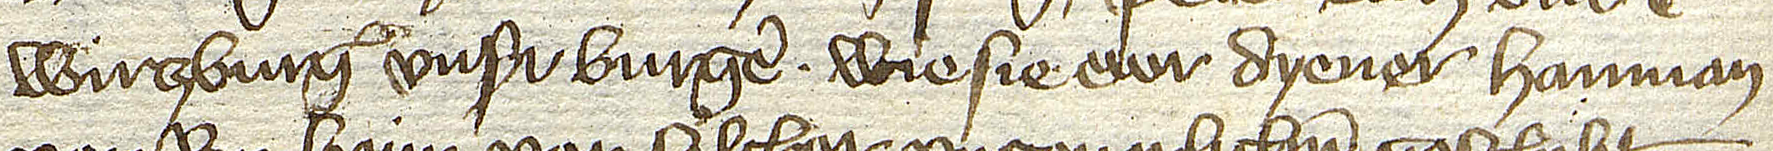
wircʒburg* vnſ*r burge* . wie ſie ewr dyener hanman
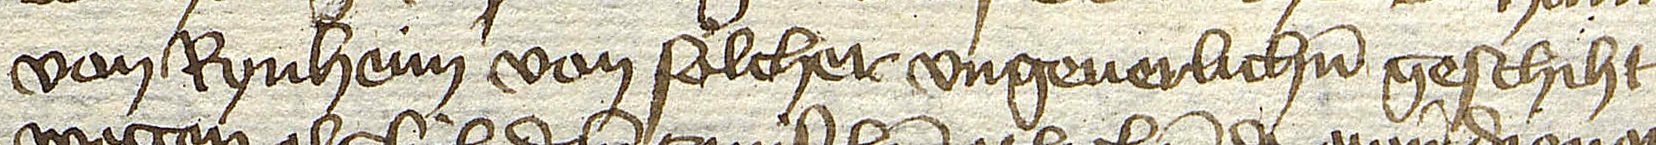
von Rynheim von ſölcher vngeuerlichn* geſchiht
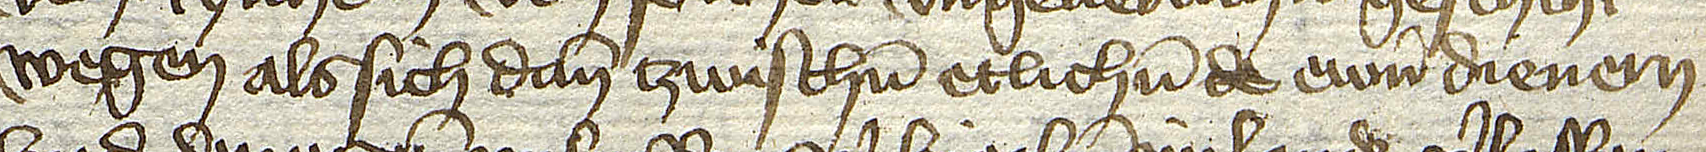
wegen als ſich dan* cʒwiſchn* etlichn* de ewn* dienern
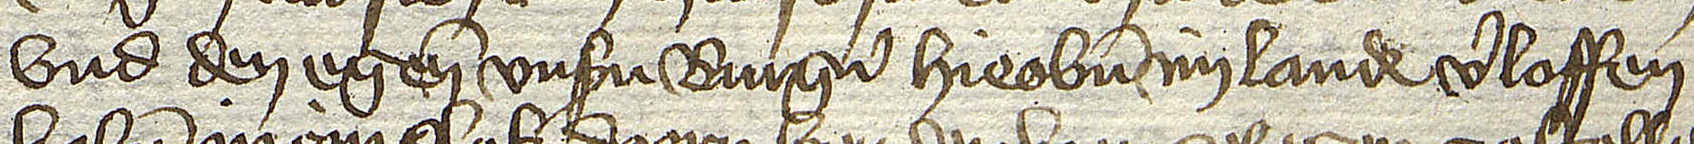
vnd den egen* vnſ*n Burgn* hieobn* im lande v*loffen
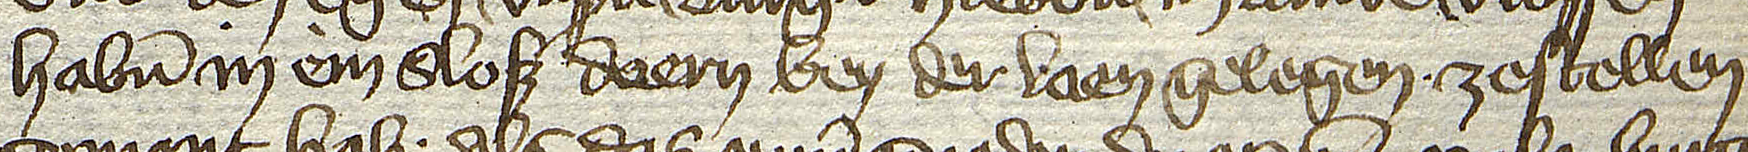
habn* in ein Sloſʒ daern bey der laen gelegen . cʒeſtellen
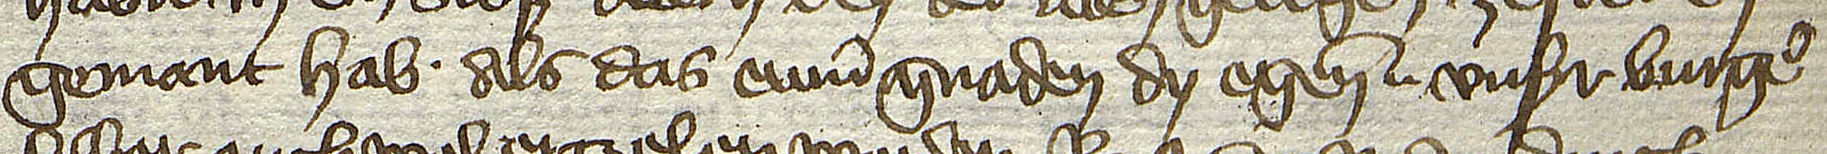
gemant hab . Als das ewn* gnaden dy egen* ~ vnſ*r burge*
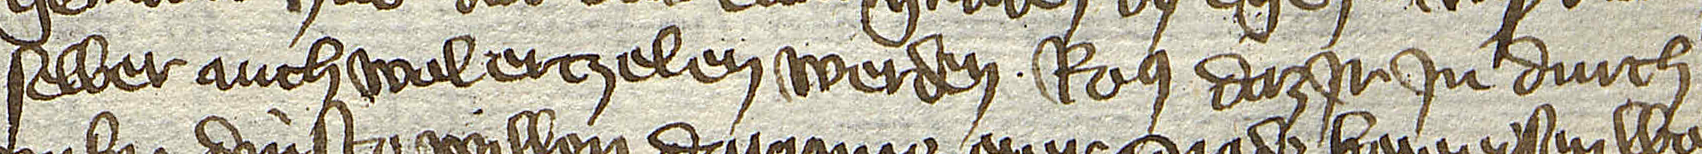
ſelber auch wol ercʒelen werden . Ro* daʒ Ir In durch
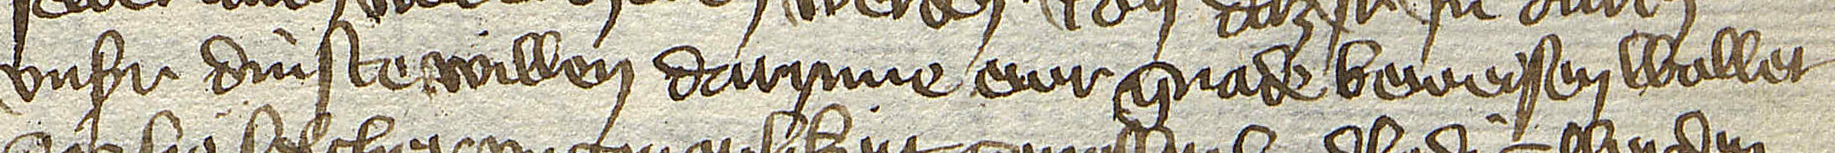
vnſ*r dinſte willen darynne ewr gnade beweiſen wollet
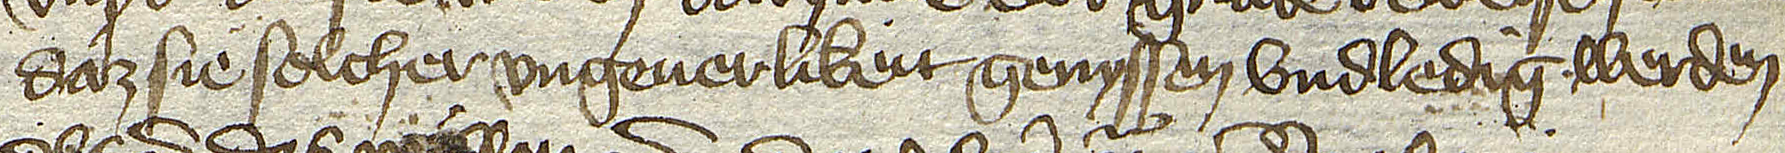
daʒ ſie ſolcher vngeuerlikeit genyſſen vnd ledig werden
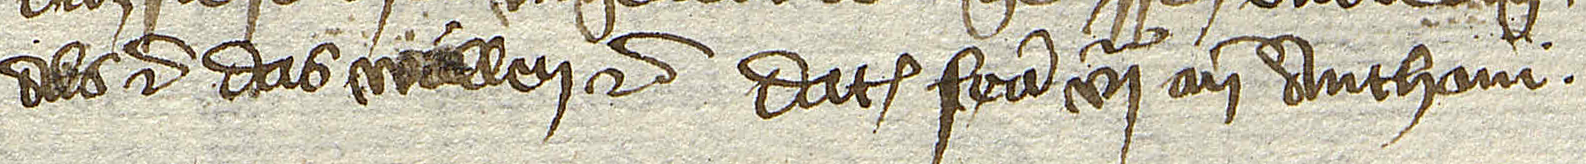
Als ec* das wöllen ec* Dat* fea* vi* an* Anthoni .
